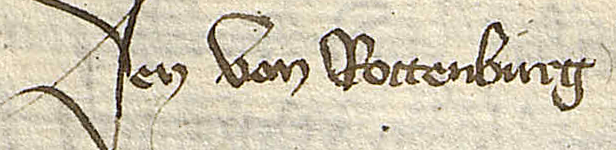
Den von Rottenbürg
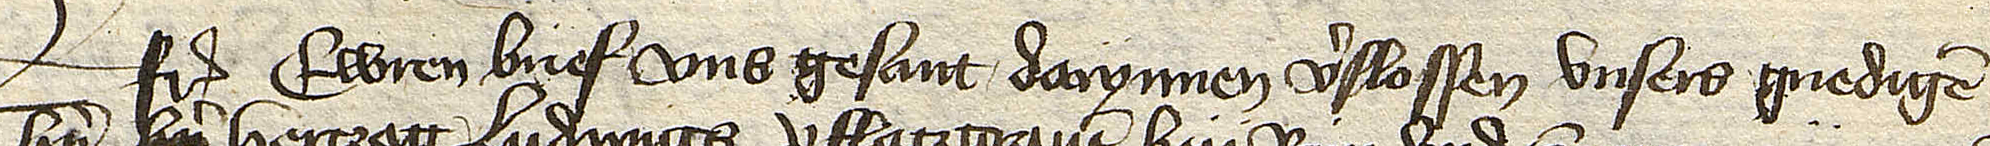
L* fr* Ewren brief vns geſant / darynnen v*ſloſſen vnſers gnedige*
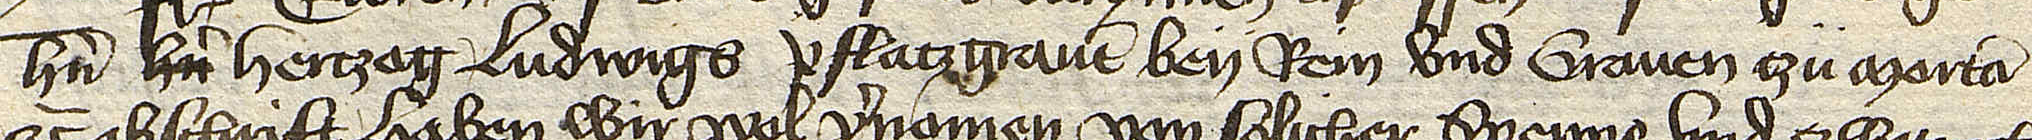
hn* hn* hercʒog Ludwigs Pflacʒgraue* bey Rein vnd Grauen cʒü Morta*
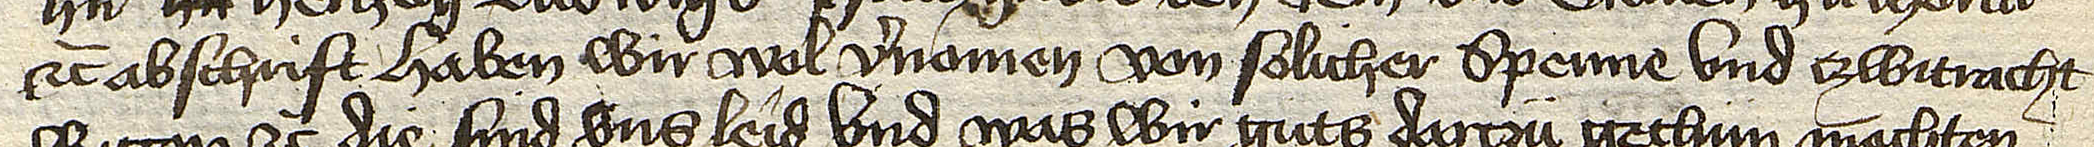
ec* abſchrift Haben wir wol v*nomen von ſolicher Spenne vnd cʒitracht
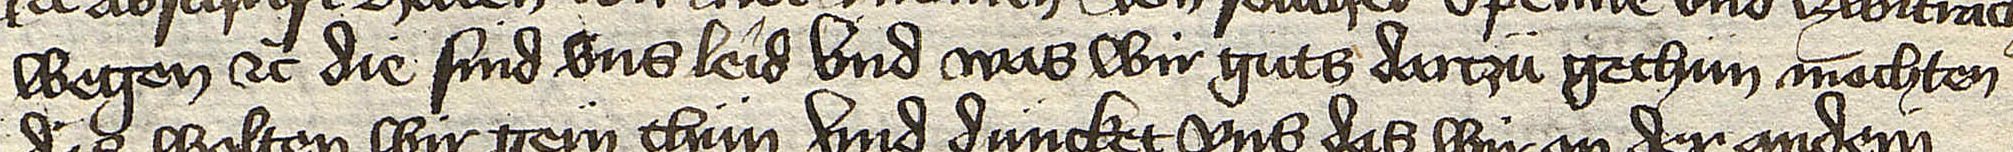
wegen ec* die ſind vns leid vnd was wir guts darcʒü gethun mochten
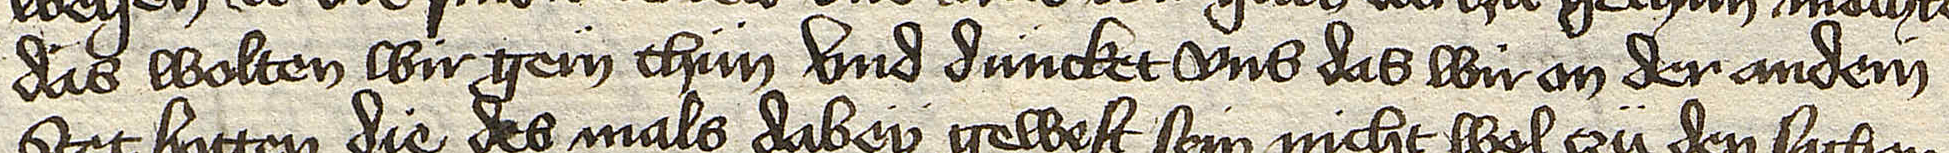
das wolten wir gern thün vnd düncket vns das wir an der andern
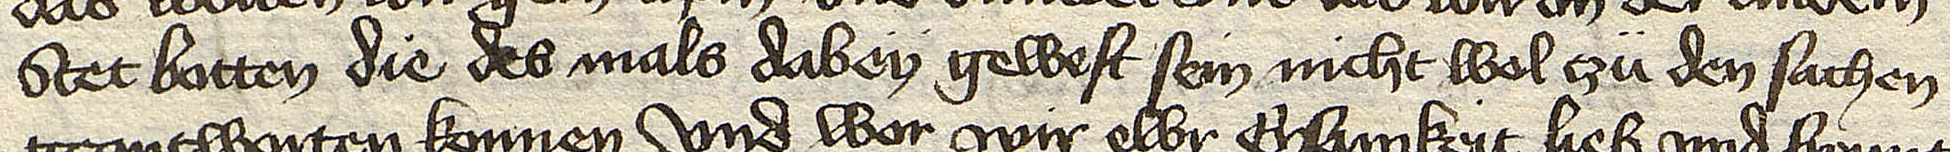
Stet botten die des mals dabey geweſt ſein nicht wol cʒü den ſachen
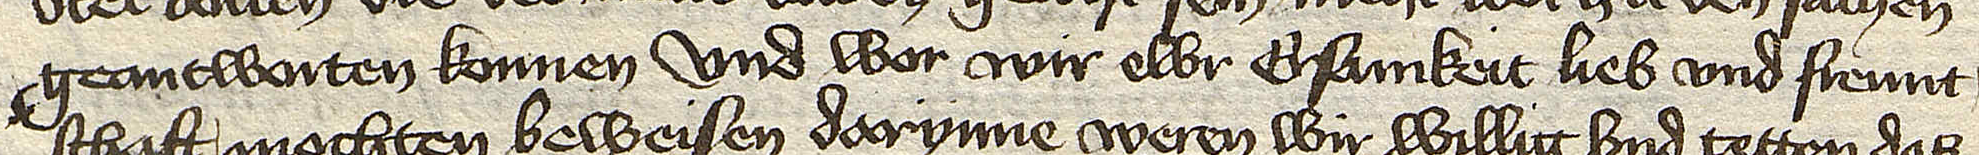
geantworten konnen vnd wor wir ewr Erſamkeit lieb vnd freunt
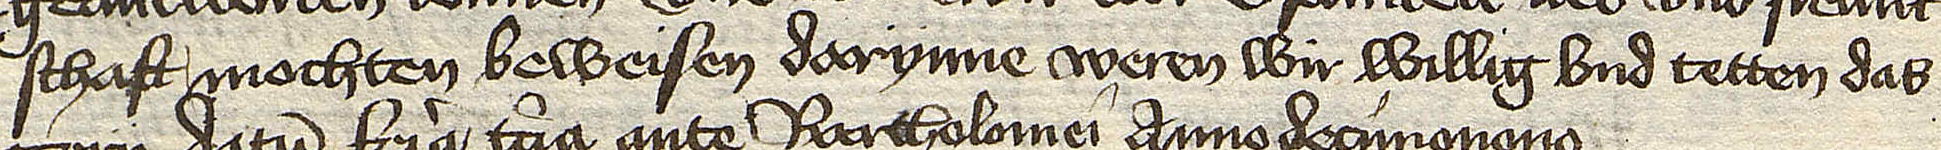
ſchaft mochten beweiſen darynne weren wir willig vnd tetten das
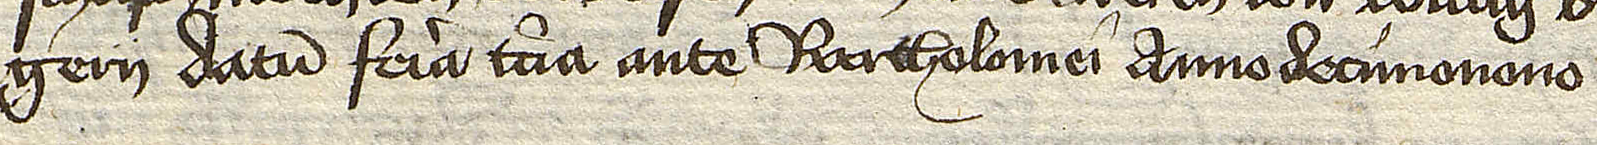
gern datu* feia* t*cia ante Bartholomei Anno decimonono
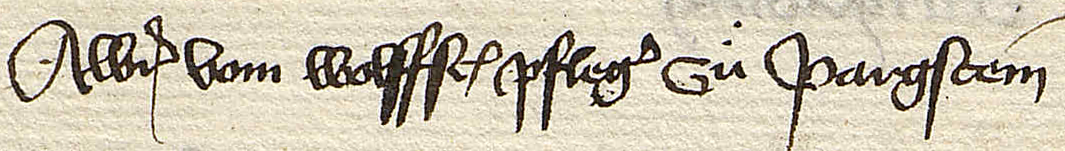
Albr* vom wolffſt* pfleg* cʒü Pargſein
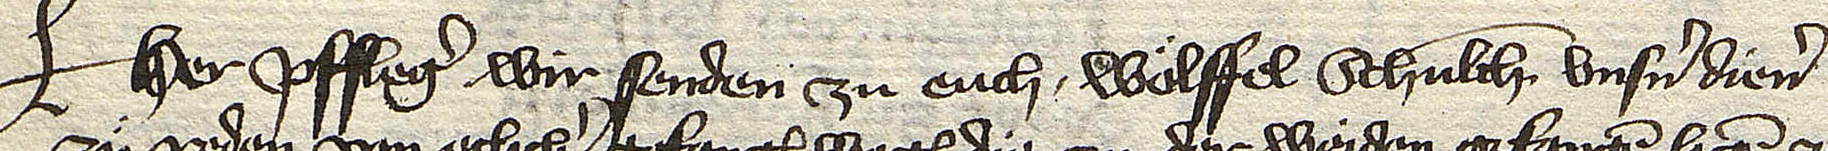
L* Her pfleg* wir ſenden cʒu euch / Wölffel Schulth* vnſn* dien*
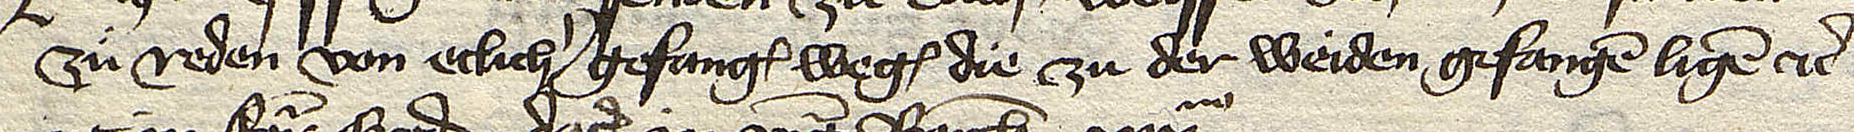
cʒü reden von etlich* gefang* weg* die cʒu der weiden gefange* lige* ec*
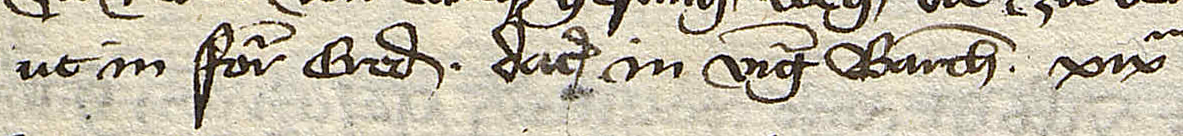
ut in for* Cred* . dat* in vig* Barth* . xix*
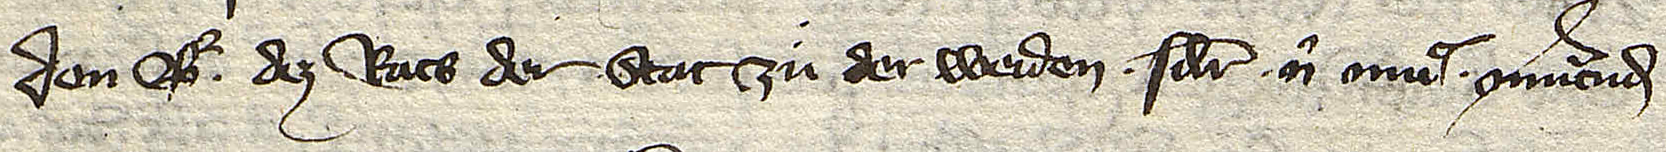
den B* deʒ Rats der Stat cʒü der weiden. ſilr* . n* mut* . mutnd*
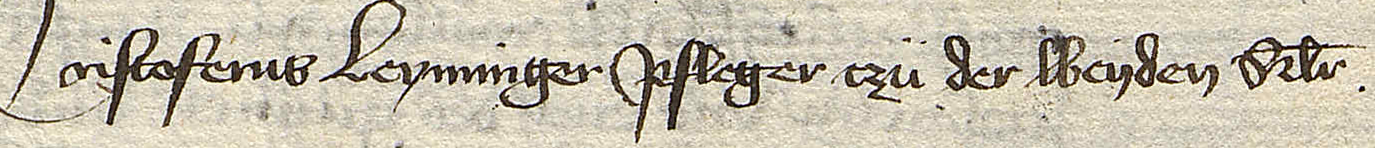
Criſtoferus Leyninger Pfleger cʒü der Weyden Silr*
